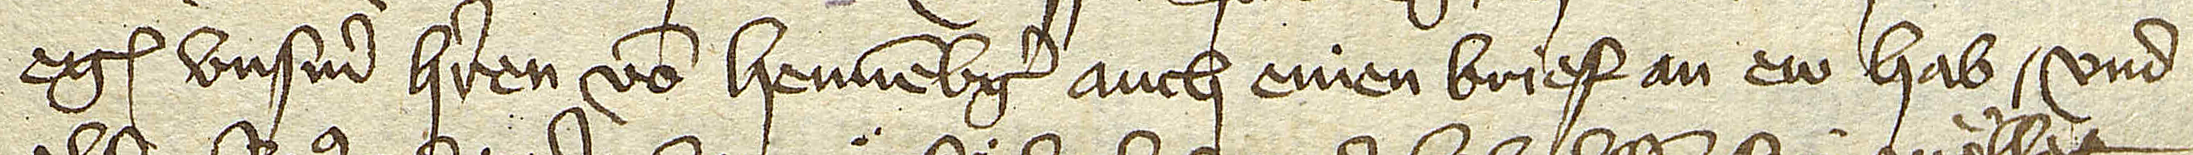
eg* vnſm* hr*en vo* henne*bg* auch einen brief an ew hab / vnd
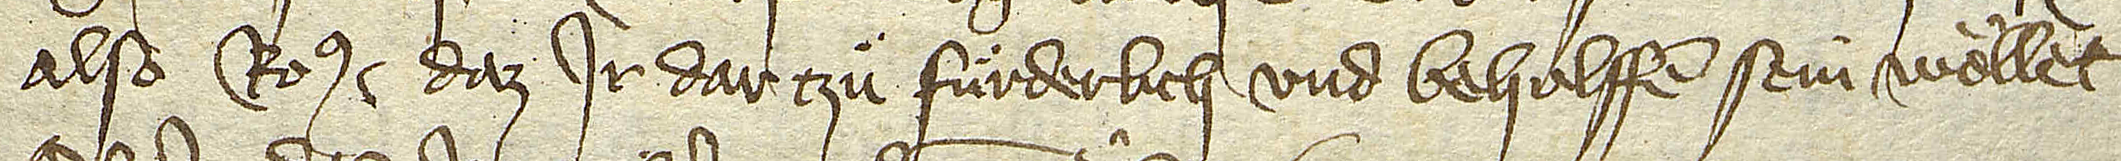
alſo Ro* / daʒ Ir dar cʒü fürderlich vnd beholffe* ſein wöllet
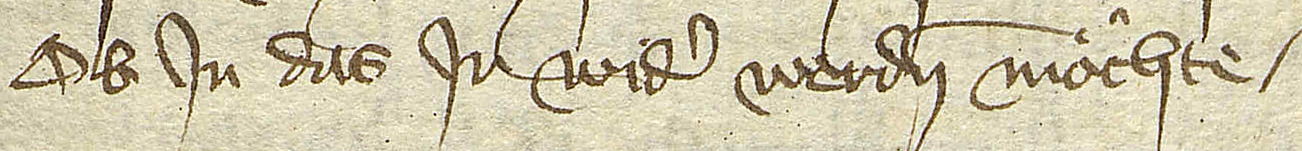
Ob In das Ir wid* werdn* möchte* / .
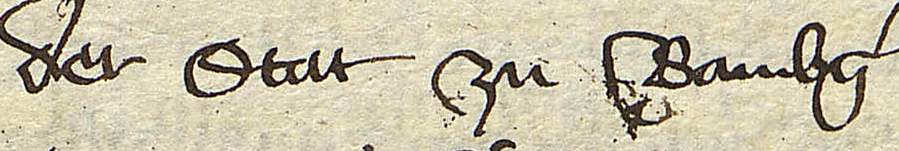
der Stat cʒu Bambg*
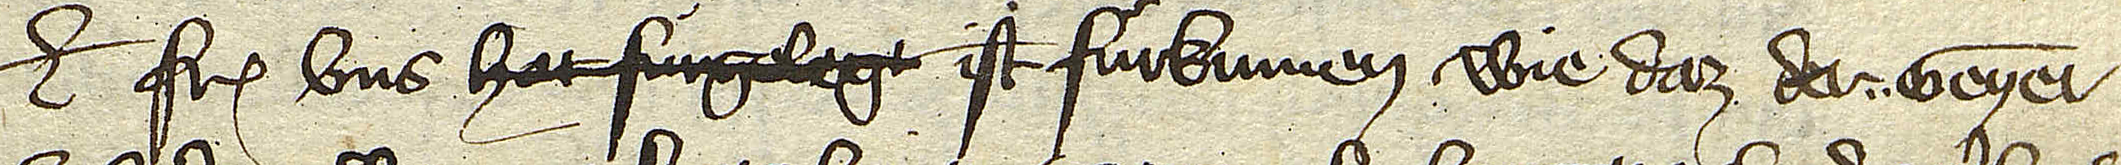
L* fr* vns hat fürgelegt iſt fürkumen / wie daʒ der ~ Geyer
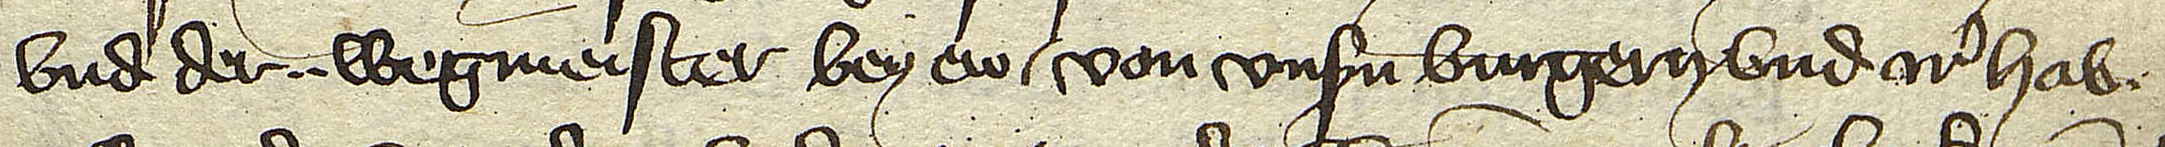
vnd der ~ wegmeiſter bey ew / von vnſ*n burgern vnd ir* hab
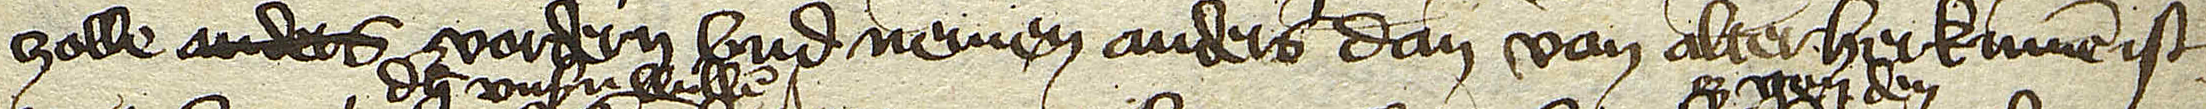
cʒolle anders vordern vnd nemen anders dan* von alter herkume* iſt
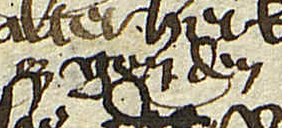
eʒ von den
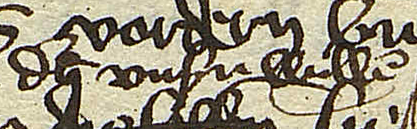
d*h vnſ*n wille*
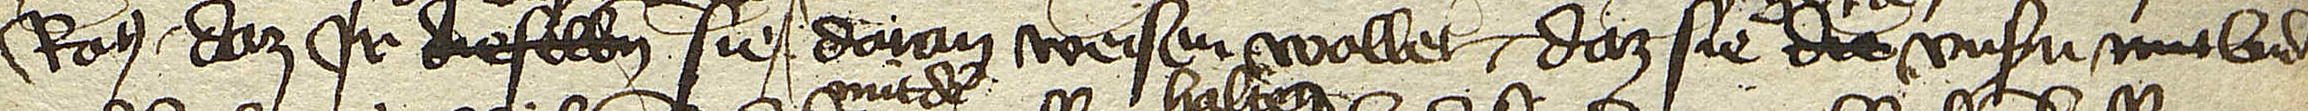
Ro* / daʒ Ir dieſelbn* ſie daran weiſen wollet / daʒ ſie die vnſ*n mit vnd
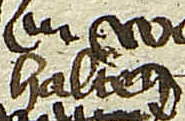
halten
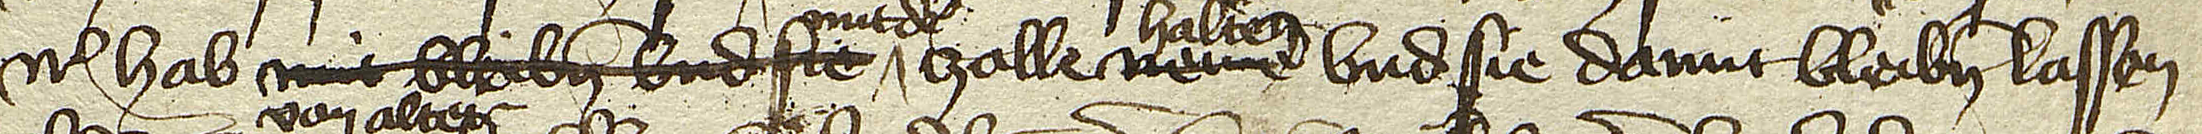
ir* hab mit bleibn* vnd ſie cʒolle neme* vnd ſie damit bleibn* laſſen
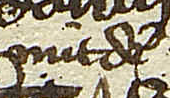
mit de*
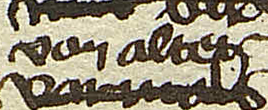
von alter
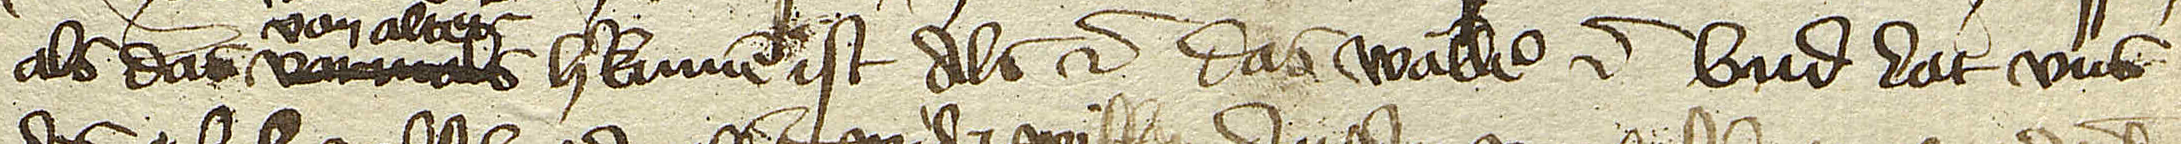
als das vormals h*kume* iſt Als ec* das wölle* ec* vnd lat vns
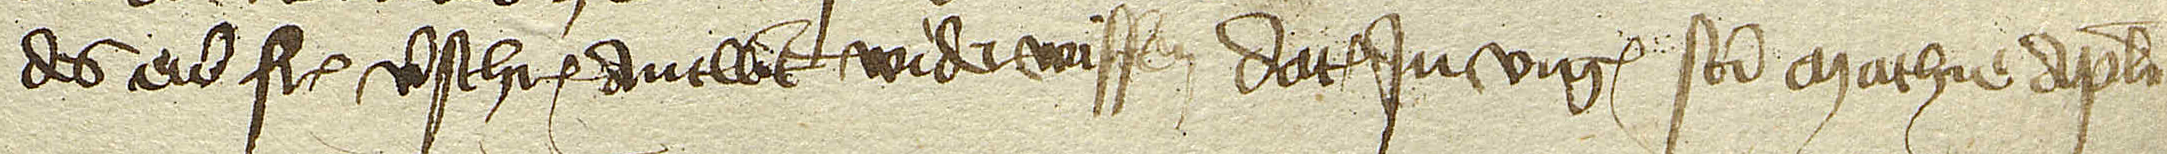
des ew* fr* v*ſchr* Antwt* widerwiſſen dat* In vig* ſci* Mathie Apli*
